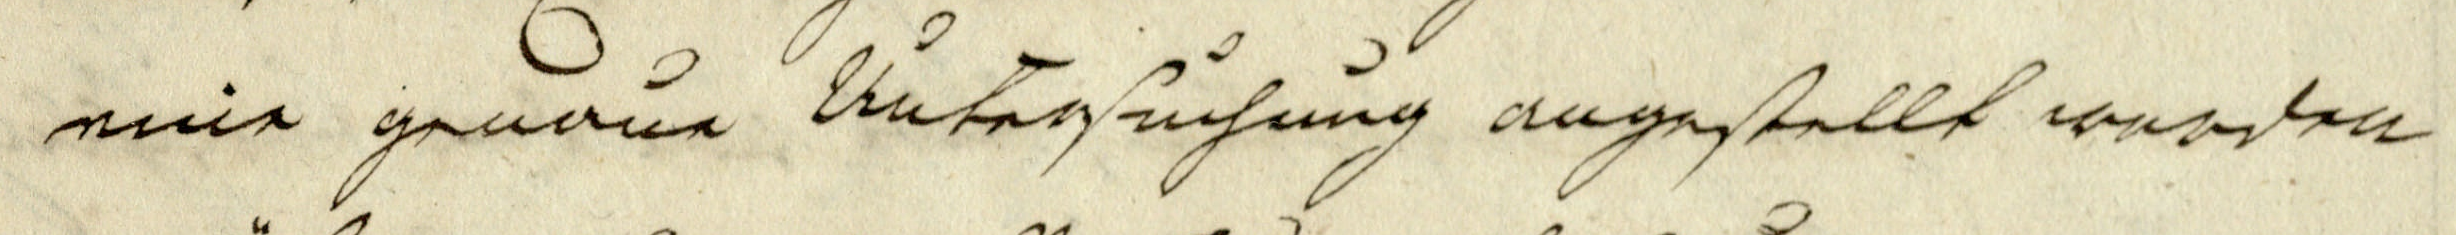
eine genaue Untersuchung angestellt werden
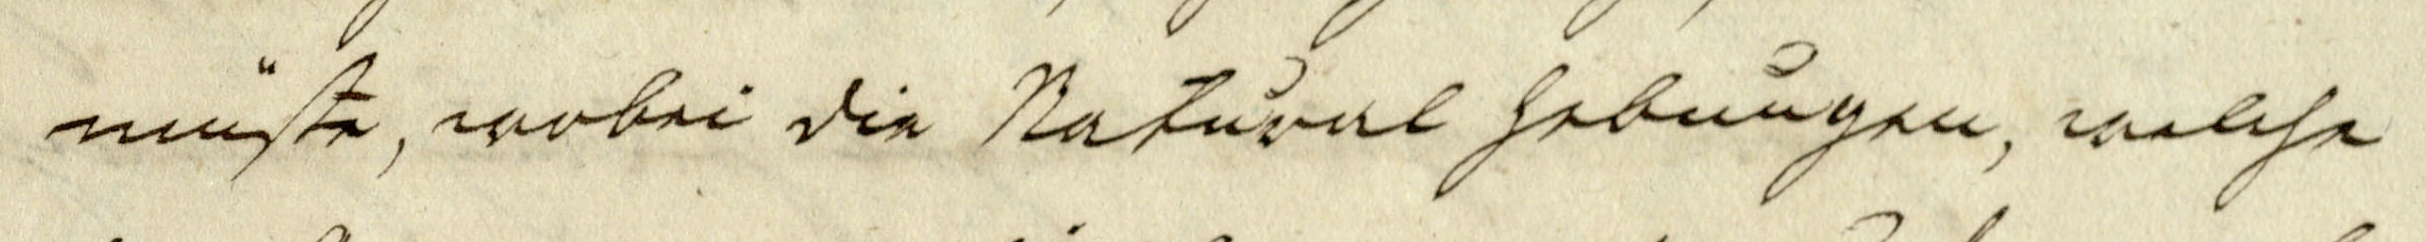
müste, wobei die Natural Hebungen, welche
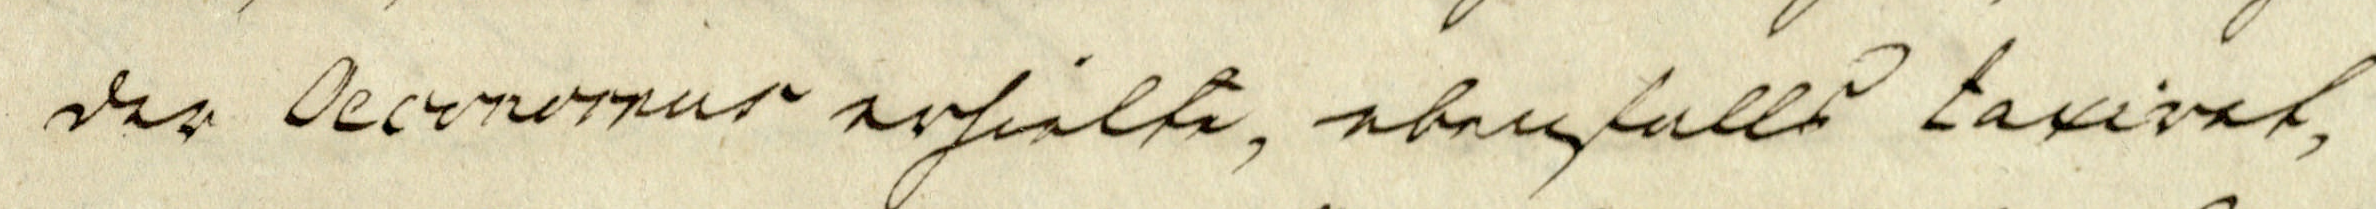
der Oeconomus erhielte, ebenfalls taxiret,
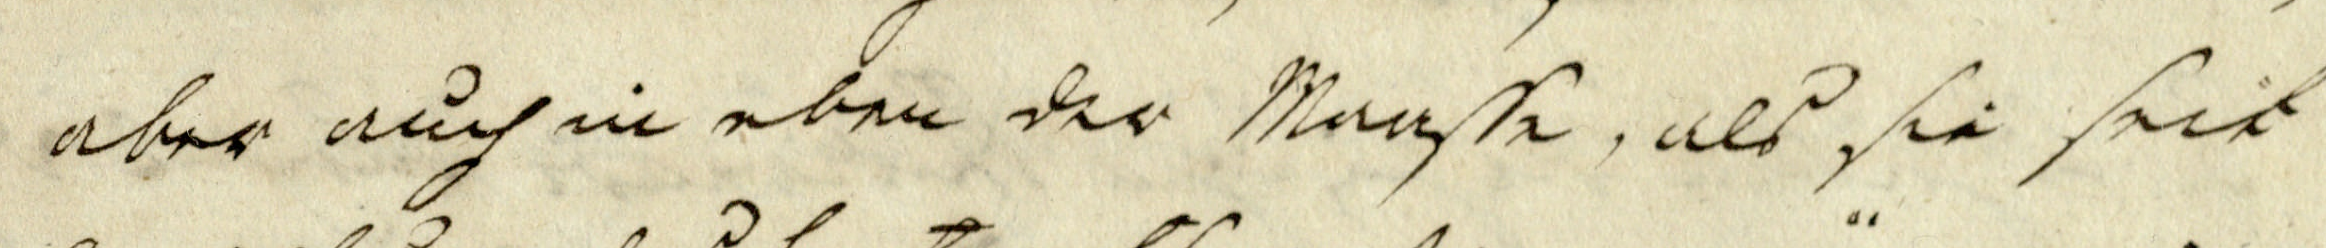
aber auch in eben der Maasse, als sie seit
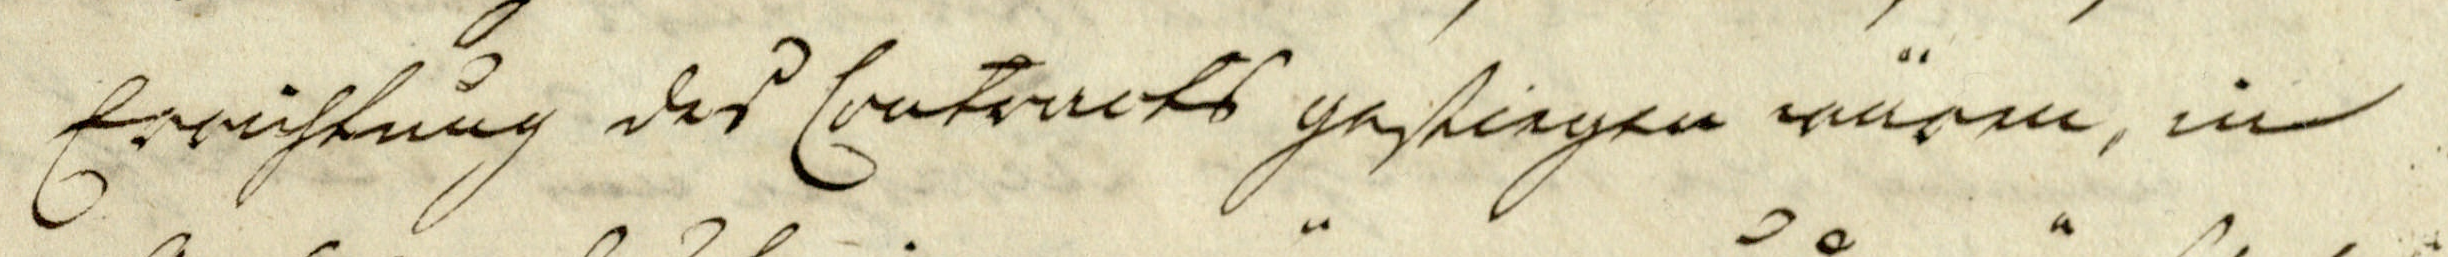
Errichtung des Contracts gestiegen wären, in
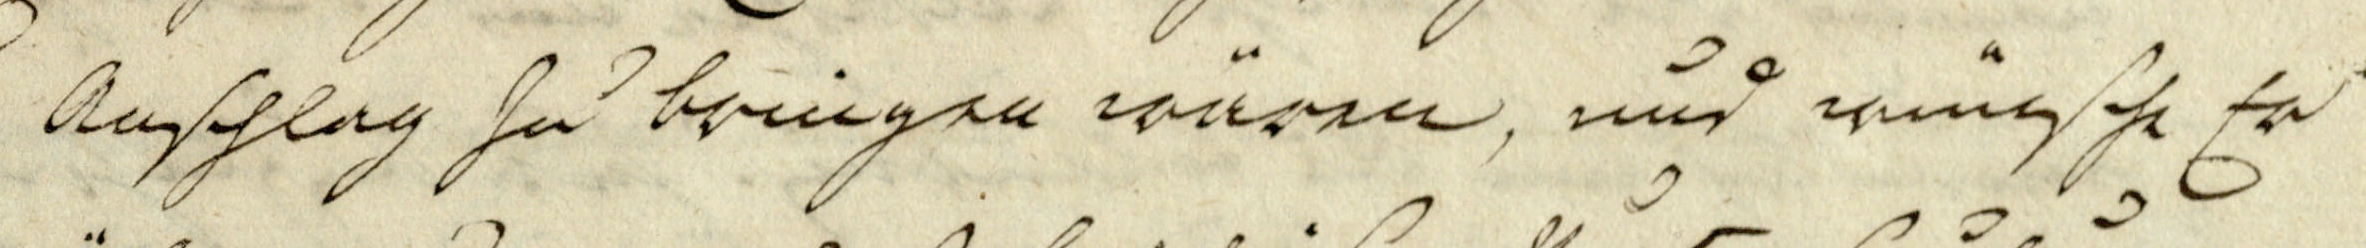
Anschlag zu bringen wären, und wünsche Er
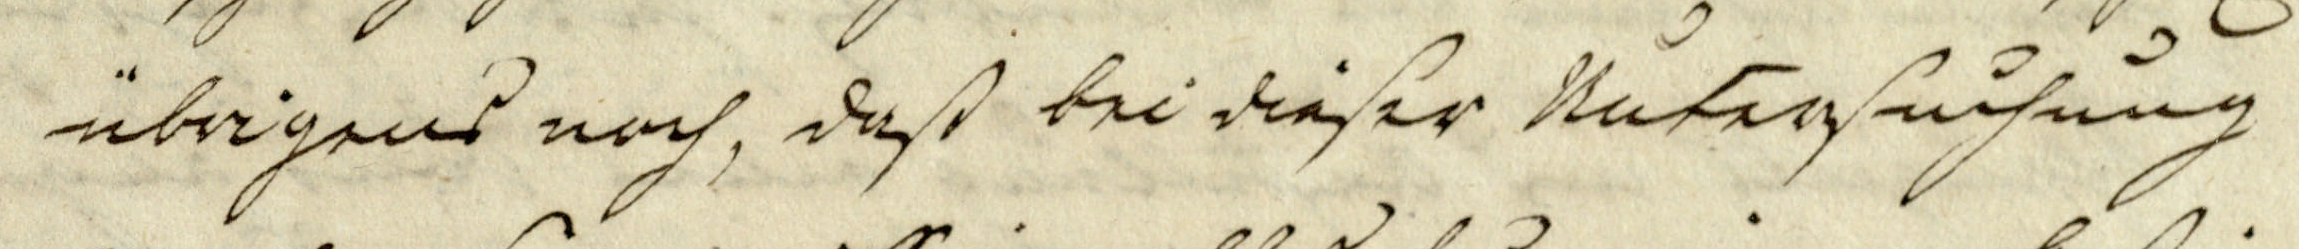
übrigens noch, daß bei dieser Untersuchung
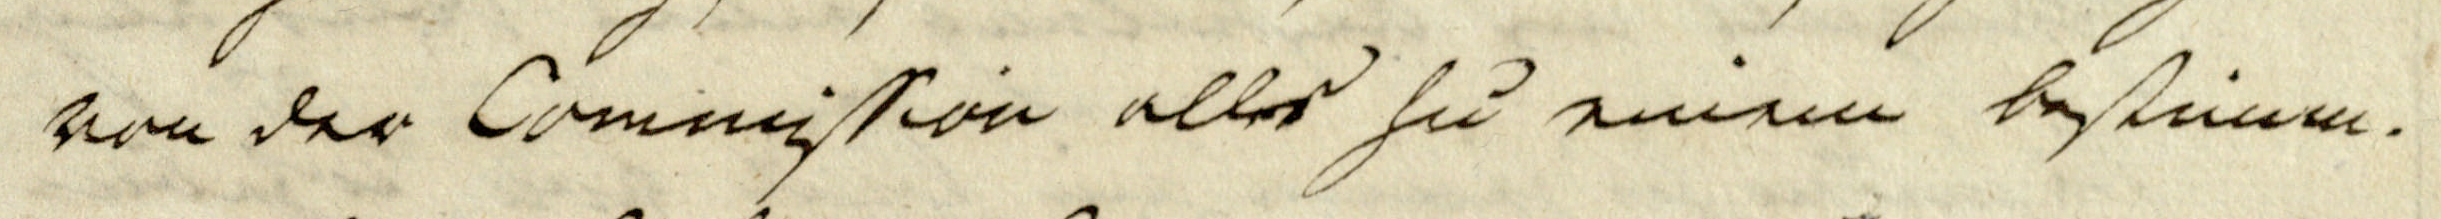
von der Commission alles zu einem bestimm¬
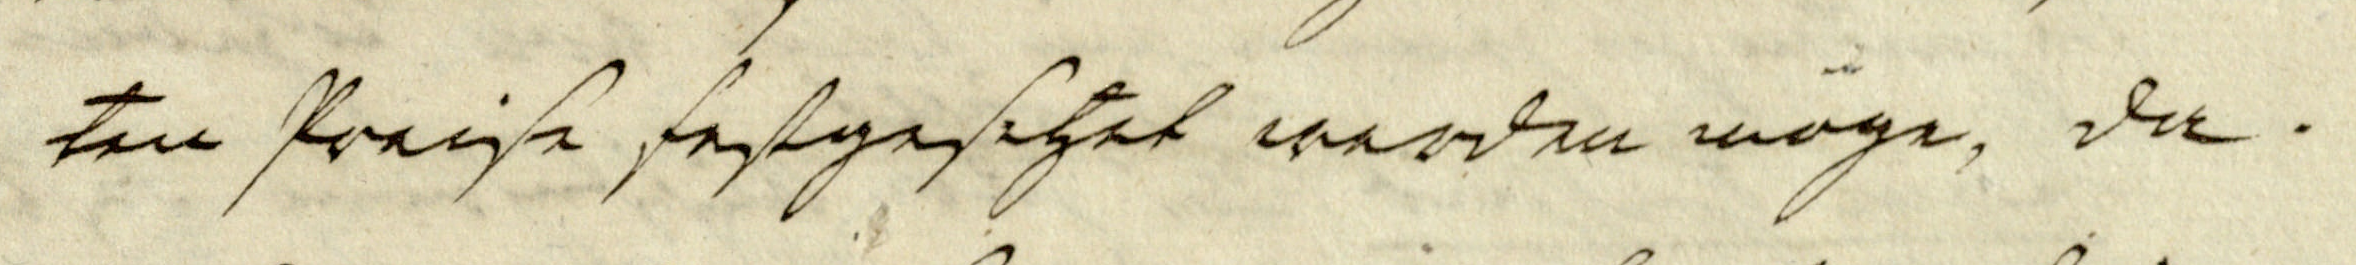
ten Preise festgesetzet werden möge, da¬
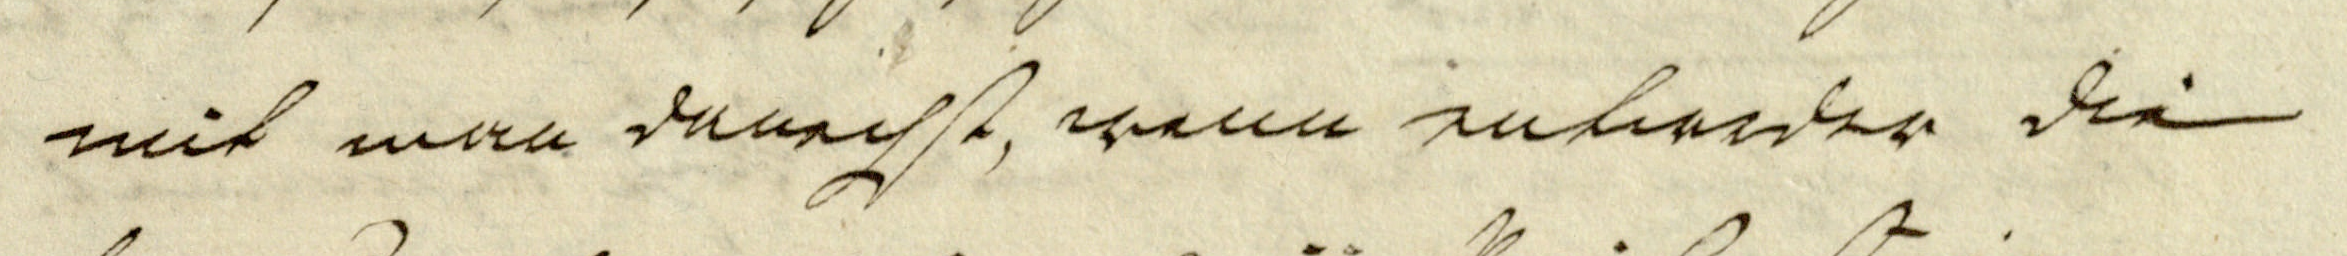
mit man danechst, wenn entweder die
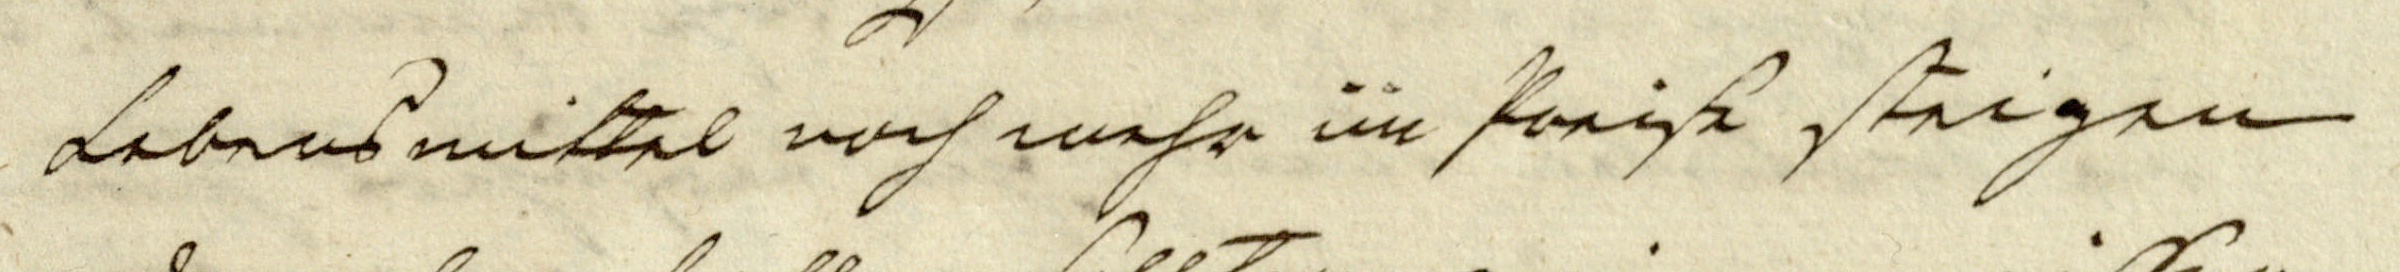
Lebens mittel noch mehr im Preise steigen
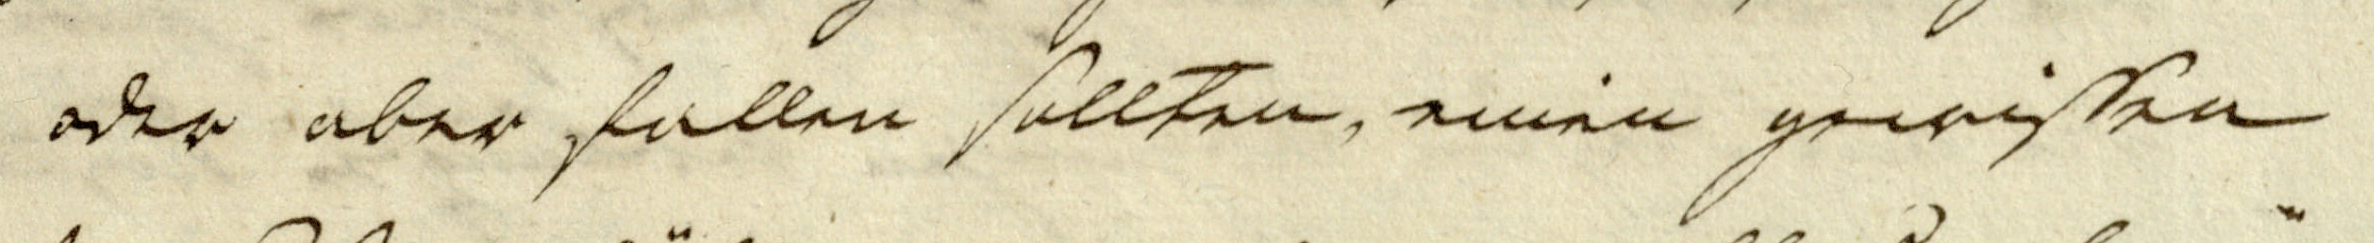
oder aber fallen sollten, einen gewissen
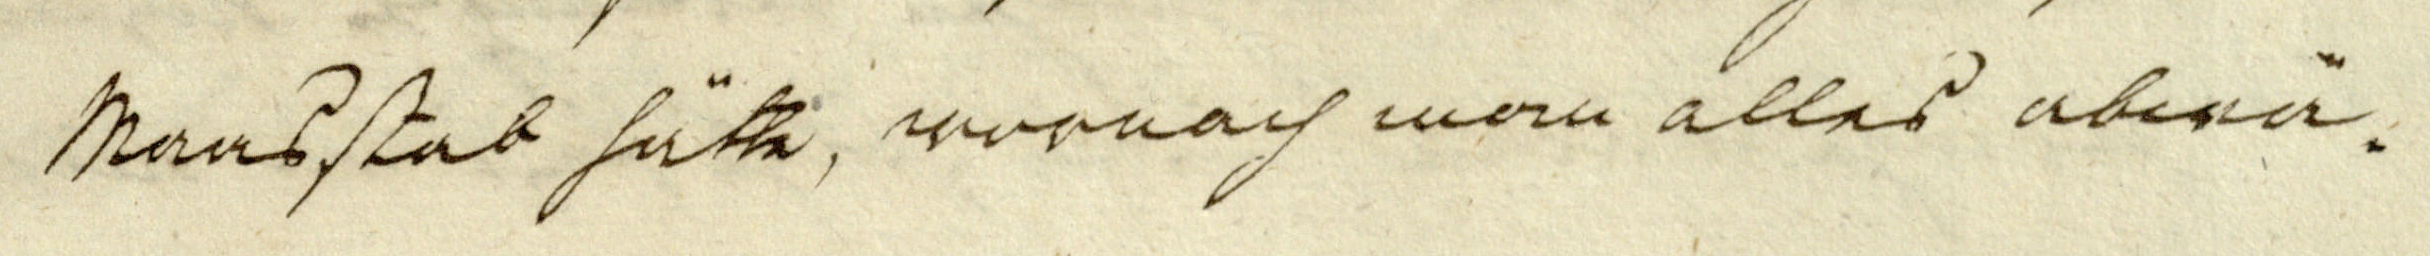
Maasstab hätte, wornach man alles abwä¬
